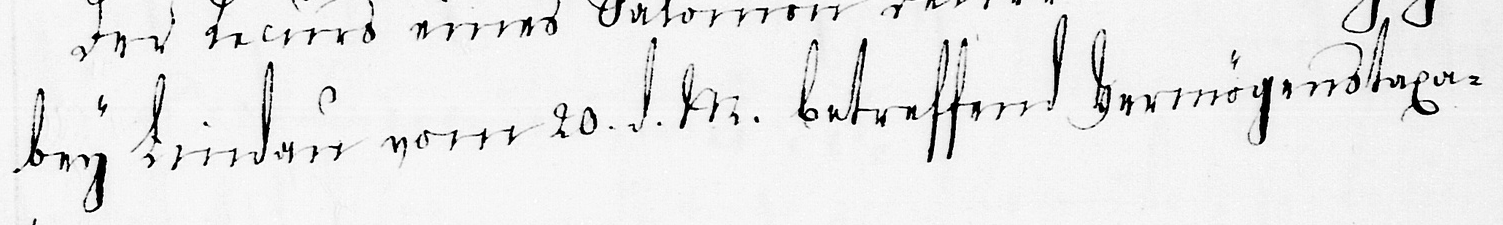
bey Lindau vom 20. d. M. betreffend Vermögenstaxa¬
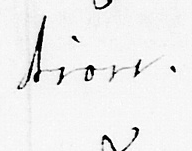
tion.
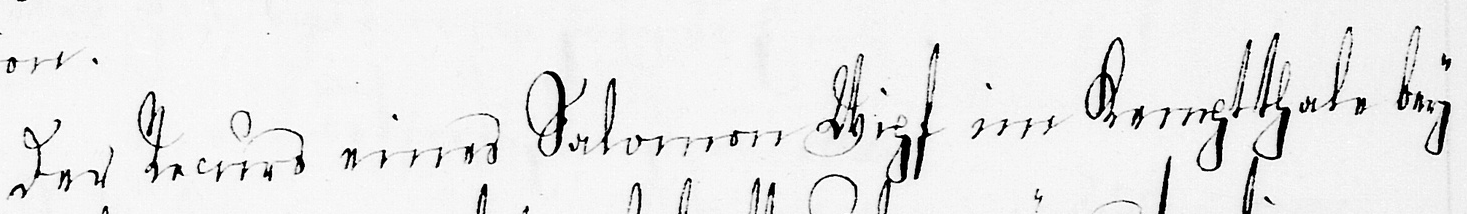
Der Recurs eines Salomon Wipf im Kemptthale bey
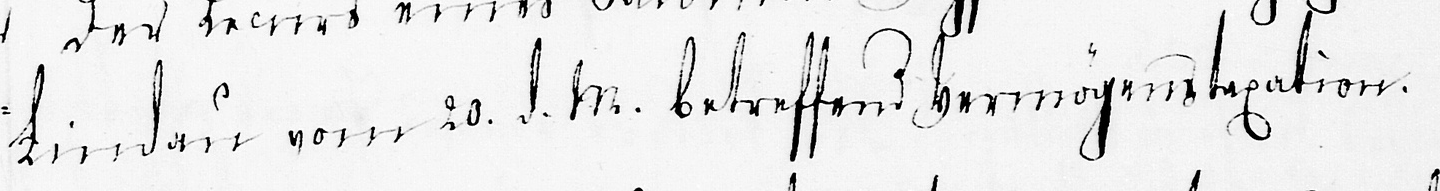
Lindau vom 20. d. M betreffend Vermögenstaxation.
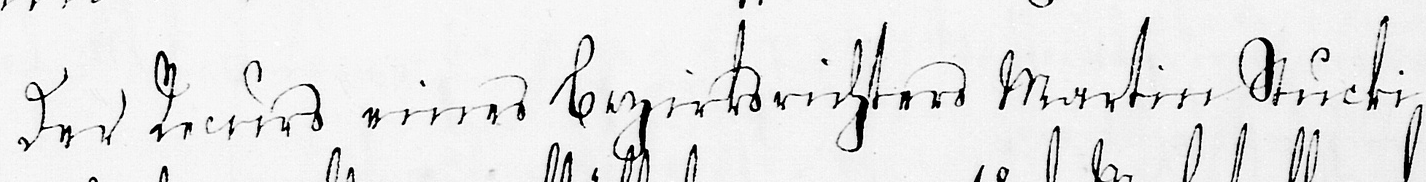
Der Recurs eines Bezirksrichters Martin Stucki
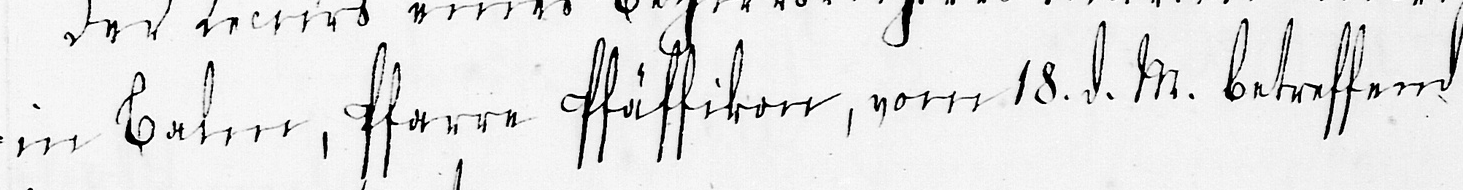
in Balm, Pfarre Pfäffikon, vom 18. d. M betreffend
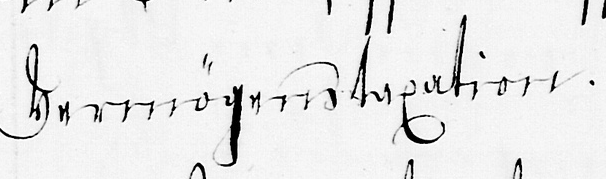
Vermögenstaxation.
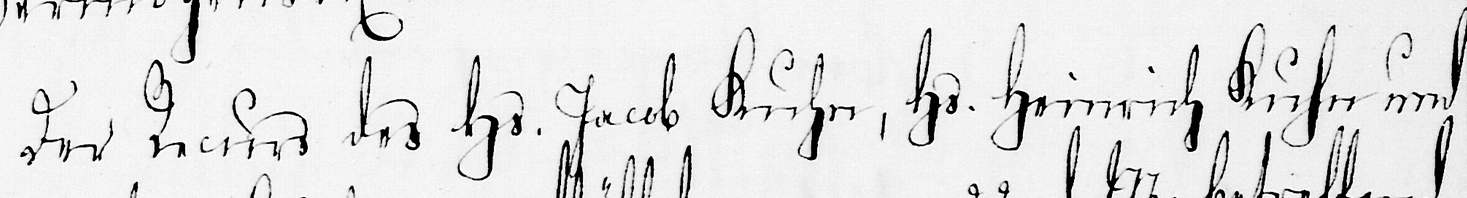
Der Recurs des Hs. Jacob Kuhn, Hs. Heinrich Kuhn und
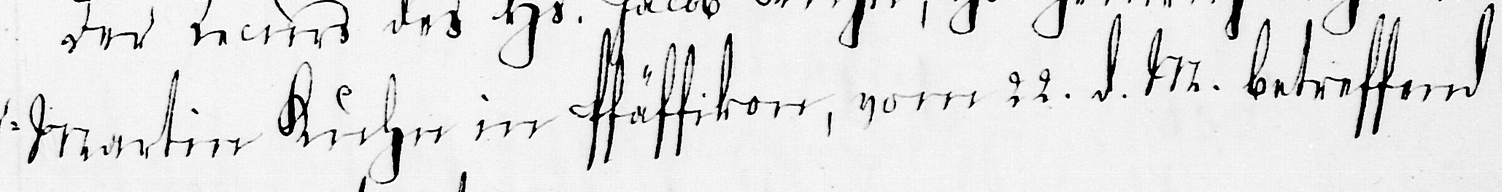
Martin Kuhn in Pfäffikon, vom 22. d. M betreffend
